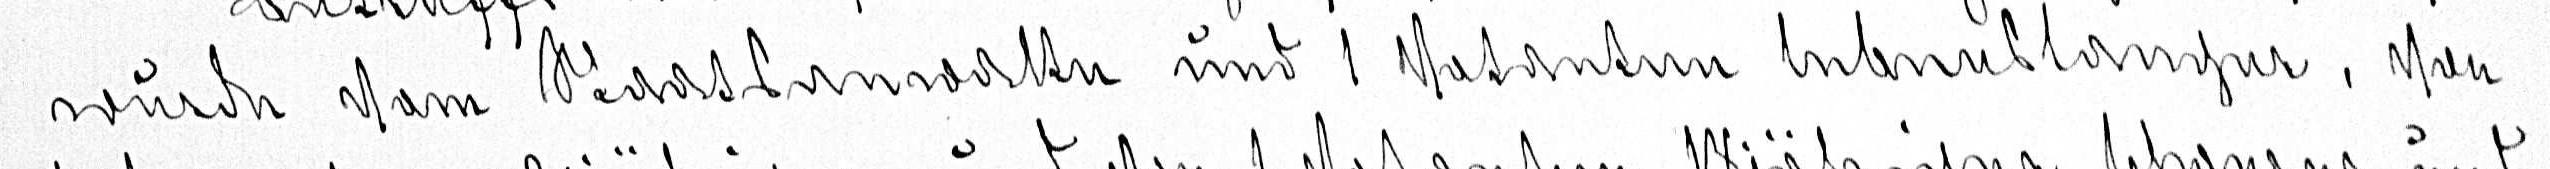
wurde vom Staatsanwalte und 1 Votanten lebenslanger, von
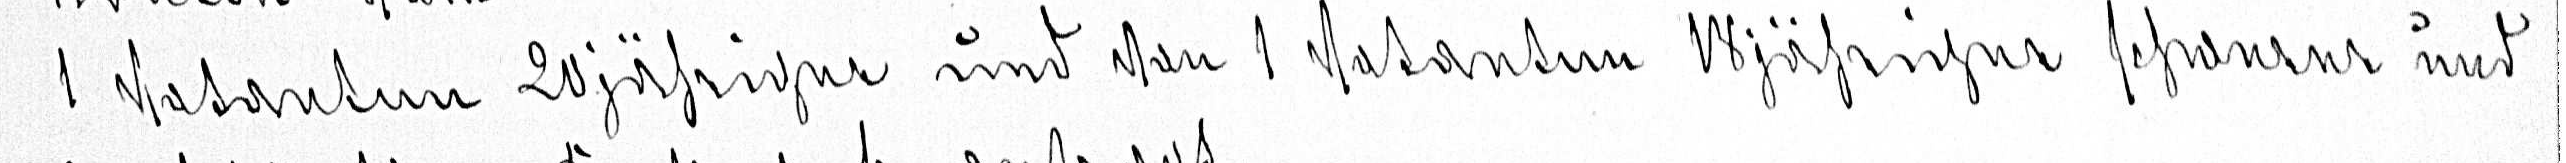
1 Votanten 20 jähriger und von 1 Votanten 18jähriger schwerer und
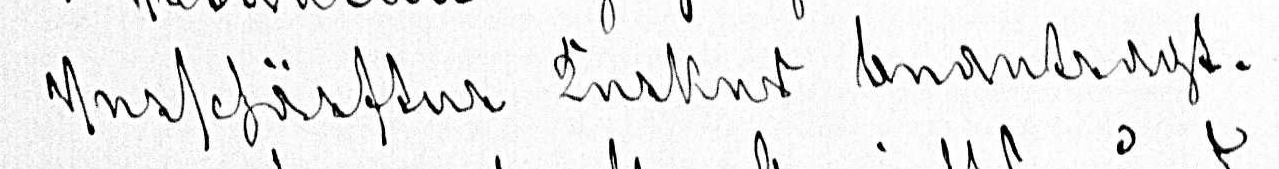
verschärfter Kerker beantragt.
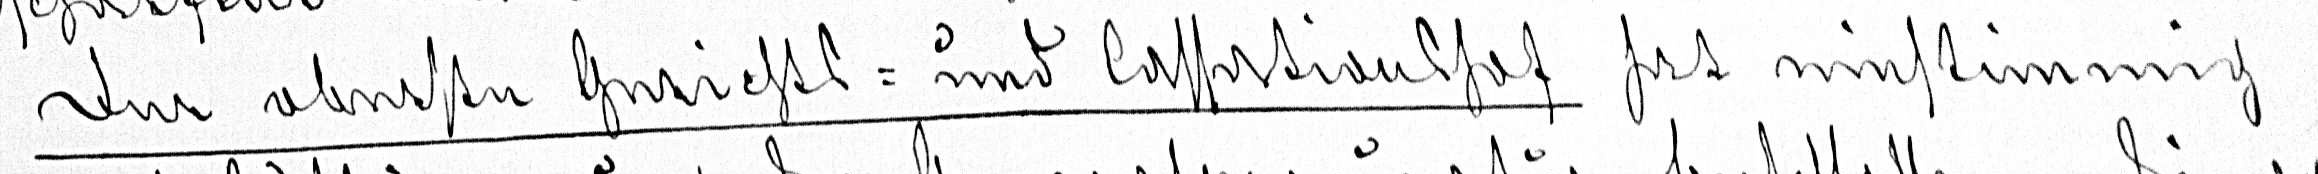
Der oberste Gerichts- und Cassationshof hat einstimmig
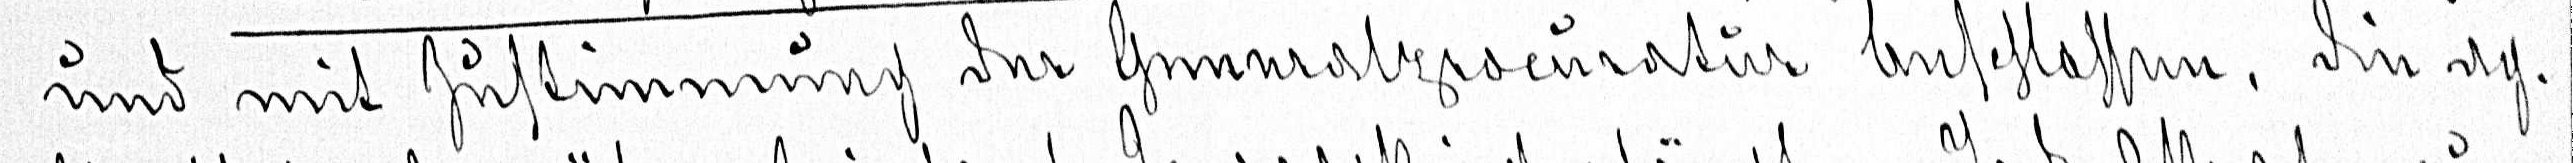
und mit Zustimmung der Generalprocuratur beschlossen, die ag.
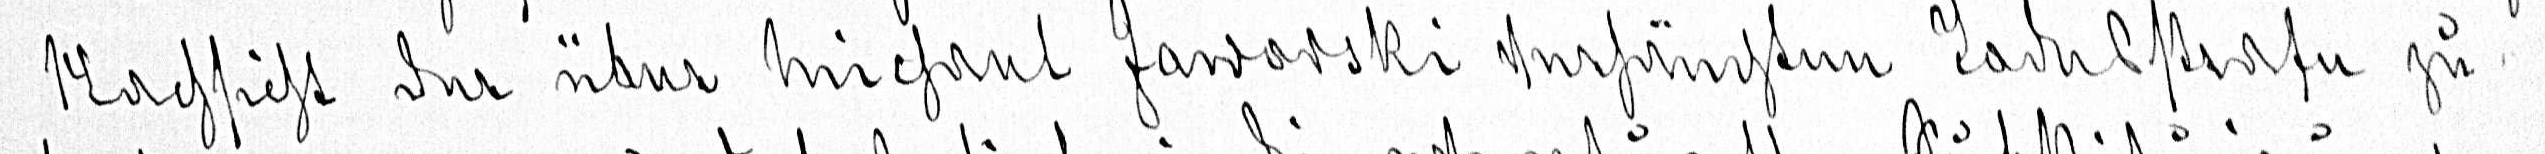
Nachsicht der über Michael Jaworski verhängten Todesstrafe zu
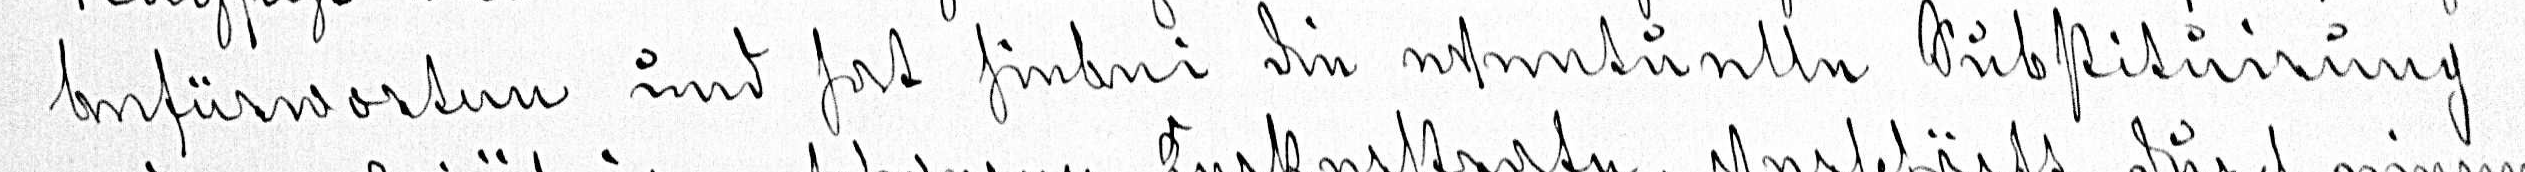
befürworten und hat hiebei die eventuelle Substituirung
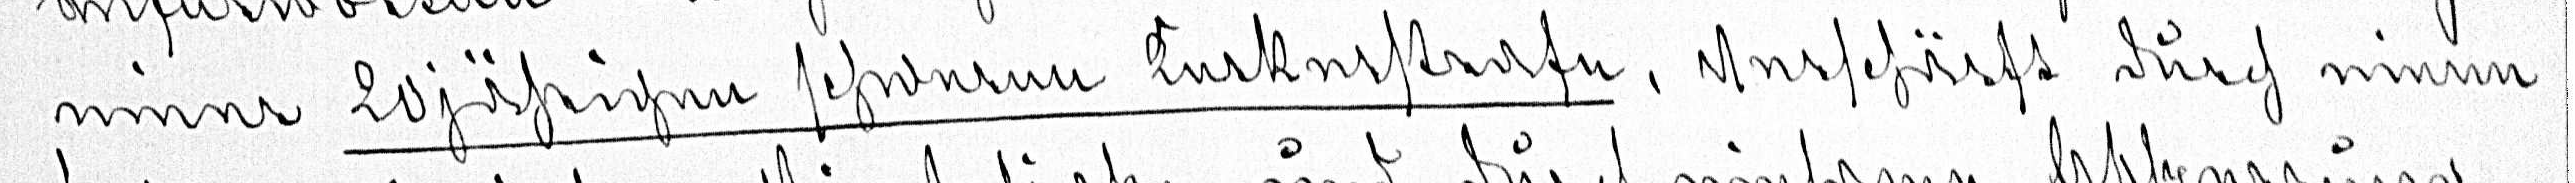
einer 20 jährigen schweren Kerkerstrafe, verschärft durch einen
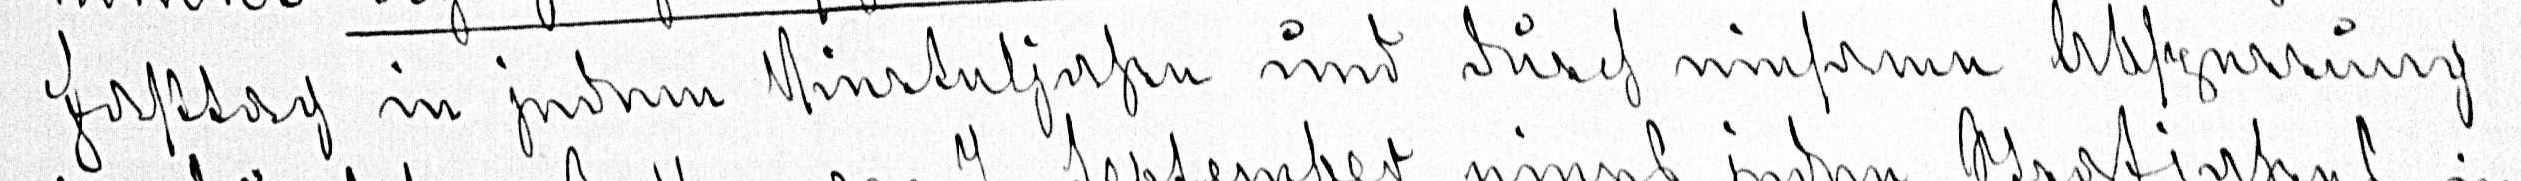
Fasttag in jedem Vierteljahre und durch einsame Absperrung
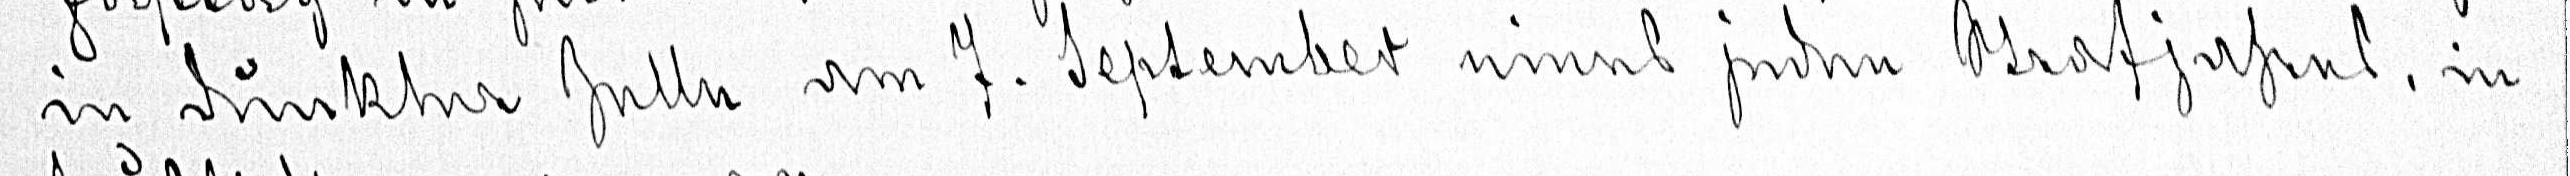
in dunkler Zelle am 7. September eines jeden Strafjahres, in
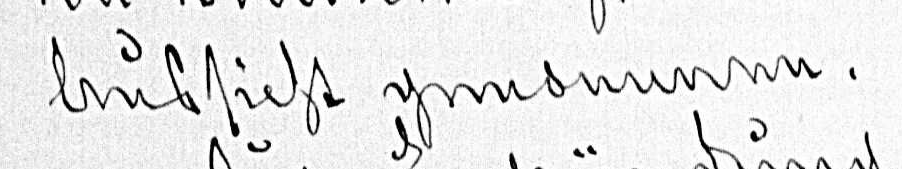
Aussicht genommen.
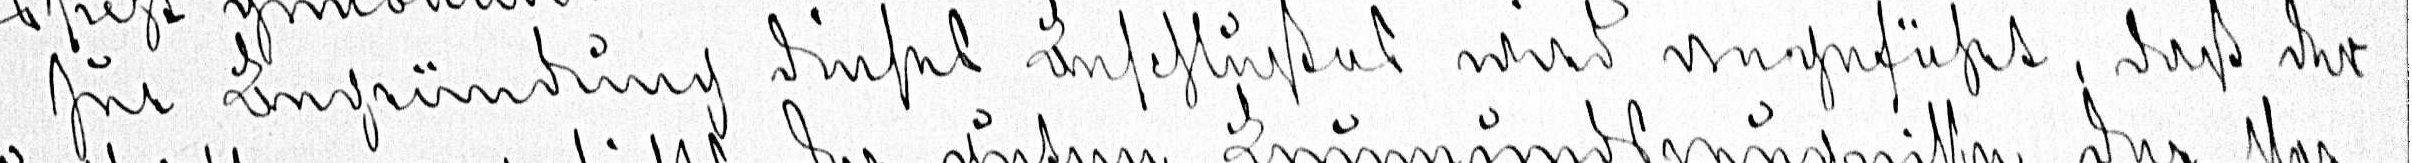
Zur Begründung dieses Beschlußes wird angeführt, daß der
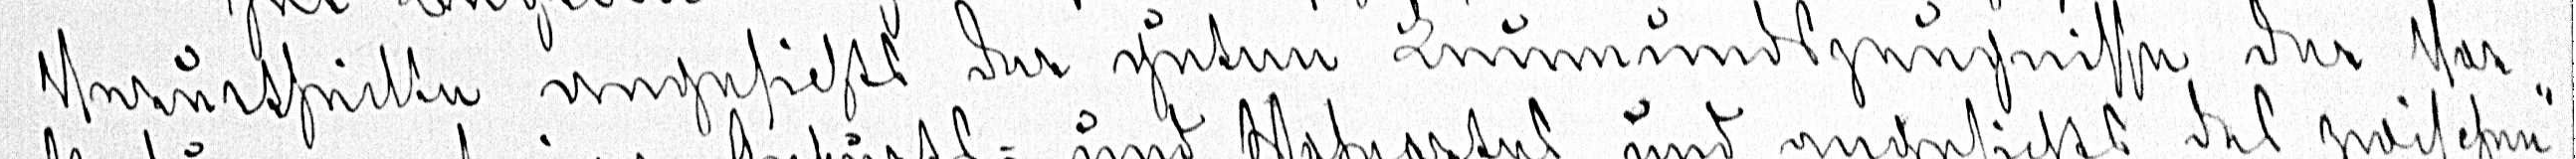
Verurtheilte angesichts der guten Leumundszeugnisse des Ver¬
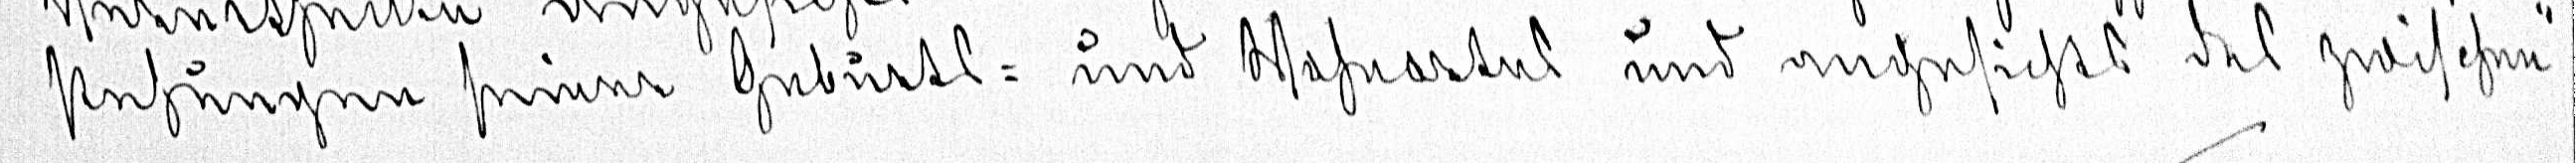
stehungen seiner Geburts- und Wohnortes und angesichts des zwischen
